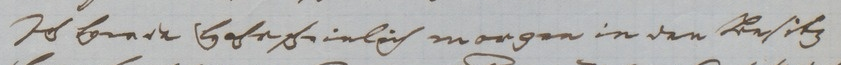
Ich werde wahrscheinlich morgen in den Besitz
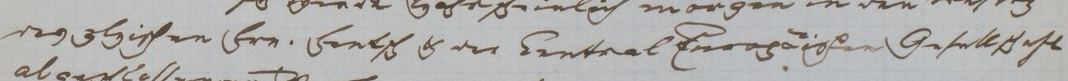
des zwischen Hrn. Hentsch & der CentralEuropäischen Gesellschaft
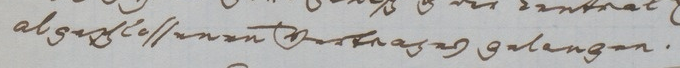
abgeschlossenen Vertrages gelangen.
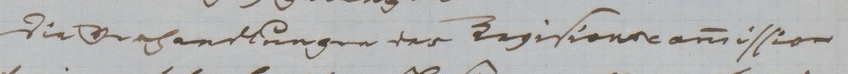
Die Verhandlungen der Revisionscommission
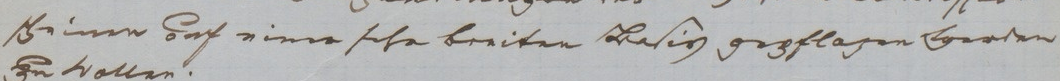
scheinen auf einer sehr breiten Basis geschlossen werden
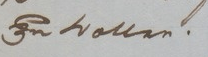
zu wollen.
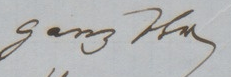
ganz Ihr
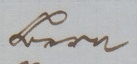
Bern
